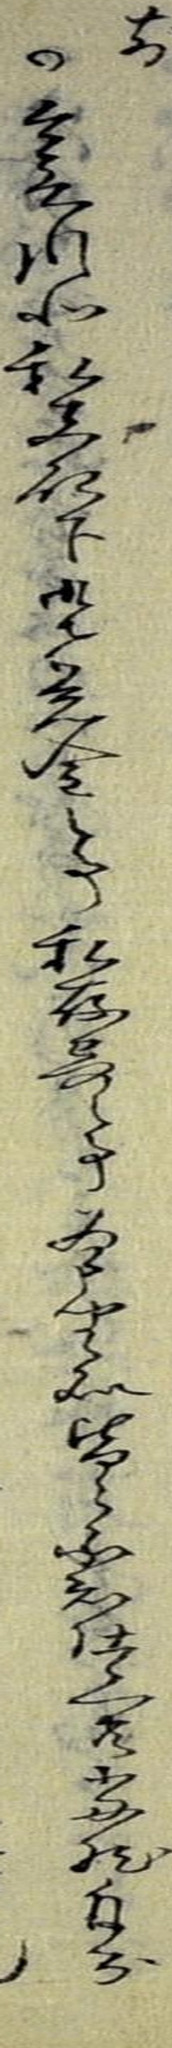〇今度川北私支配下御才覚金之事私存寄之事為申聞候処皆々承知仕候へ共当然自分
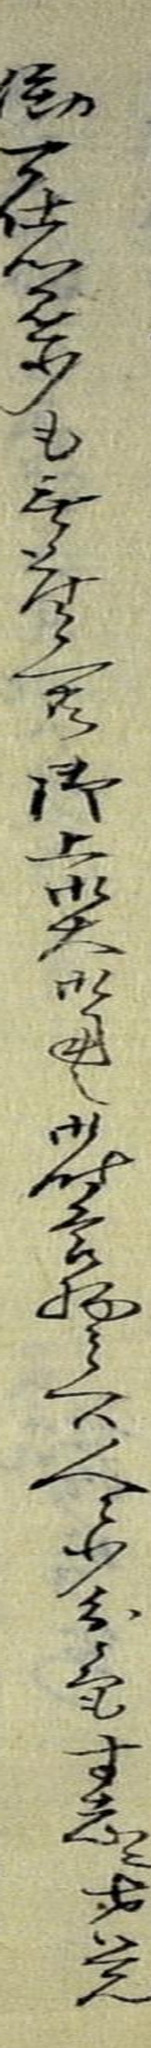働可仕心懸少も無御座候へ共御上御大御用之御時節柄ニ候ヘハ人々少分ニ而も寸志ニ才覚
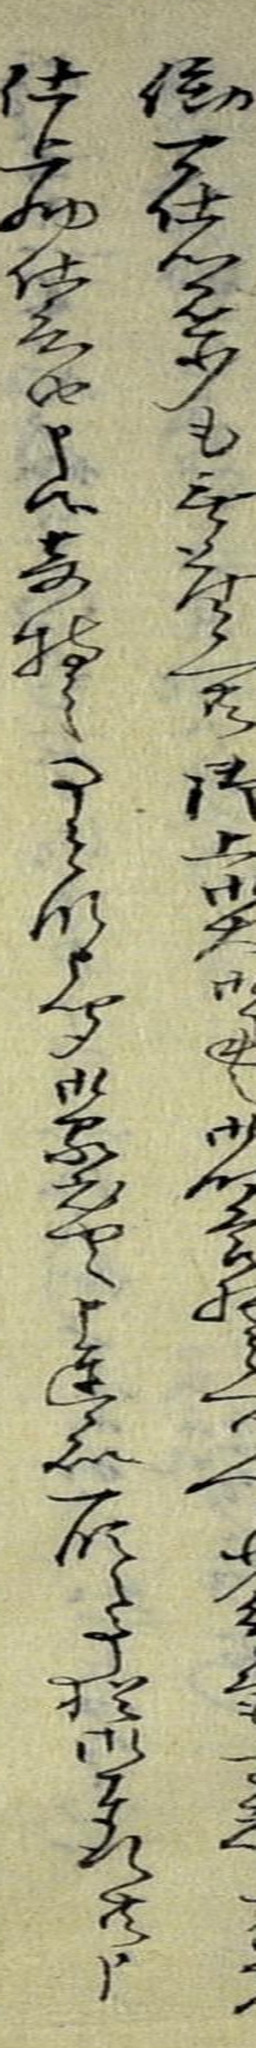仕上納仕度由申候奇特之事ニ候段申聞御家老中へ申達候処一段之事猶御奉行共申
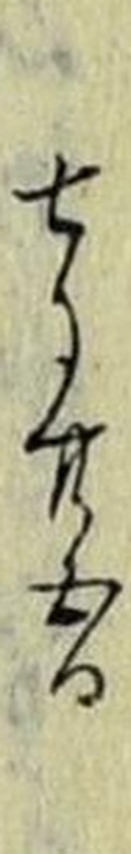十月廿五日
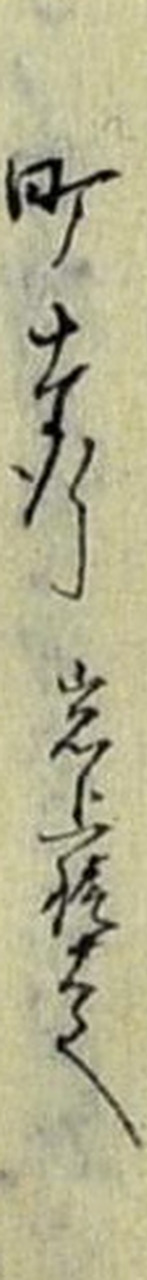町奉行岩上梶大夫
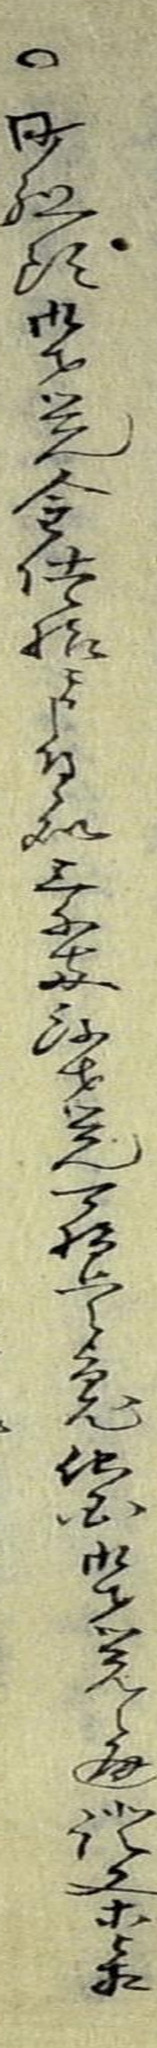〇町組頭御才覚金仕候様ニ申付候処三千両致才覚可指上之旨尤他国御才覚之通証文等被相
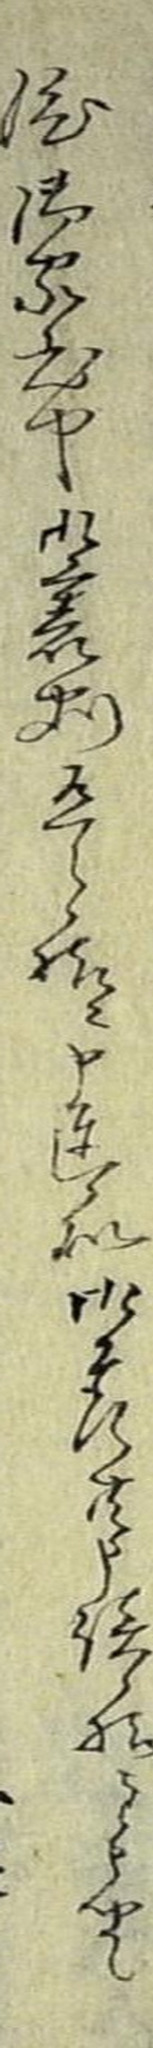渡御家老中御裏判有之候様ニ申達候処御奉行共申談候様ニ被申聞候
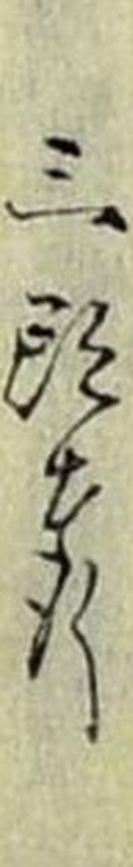三郡奉行
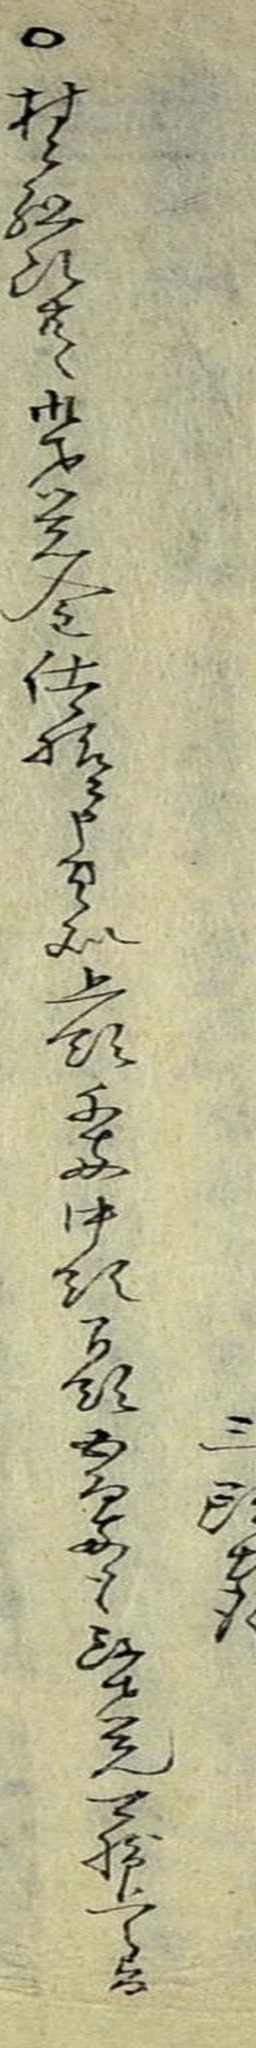〇村々組頭共へ御才覚金仕候様ニ申付候処上領千両中領下領五百両ツヽ致才覚可指上之旨
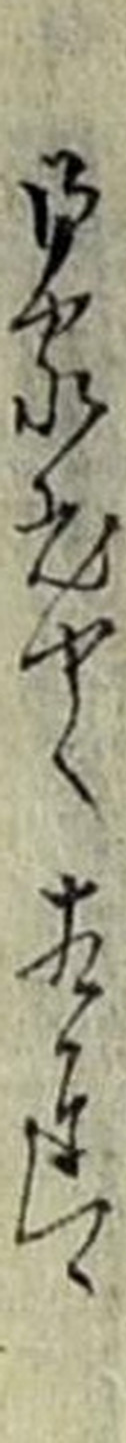御家老中へ相達候
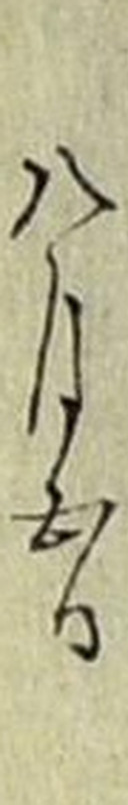八月五日
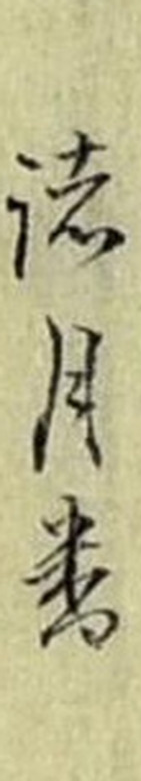諸月番
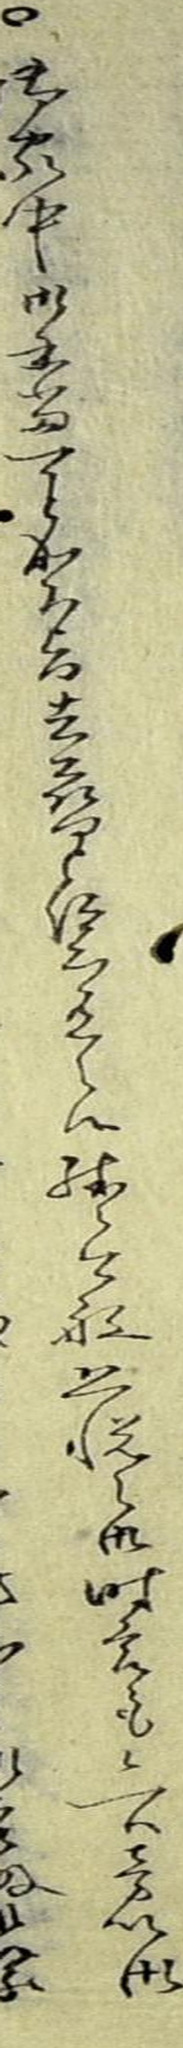〇御家中御手当可被成下旨去暮被仰出有之候殊ニ今般恐悦之御時節ニも候ヘハ旁以御
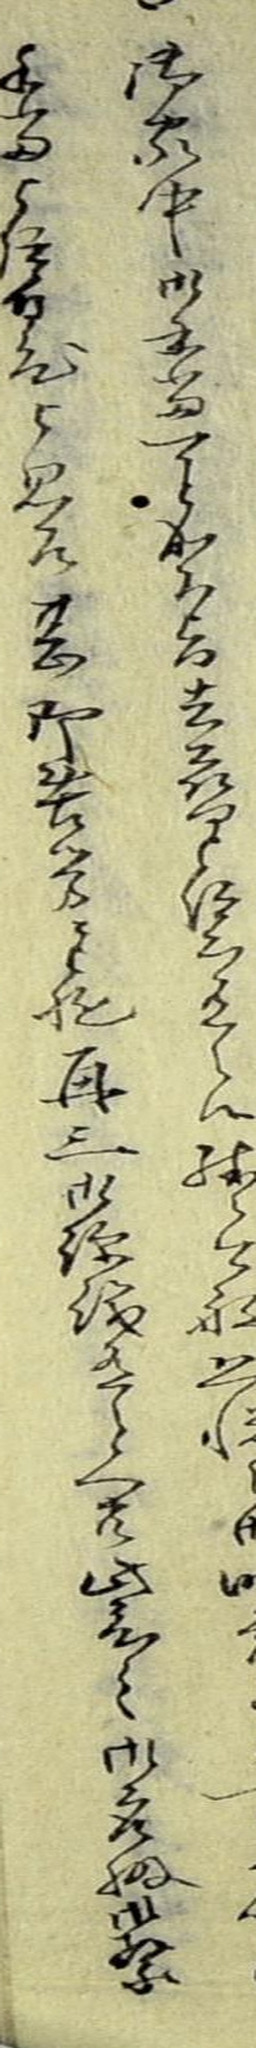手当被仰付度被思召甚御苦労ニ被遊再三御評議有之候へ共此度之御取扱御繁

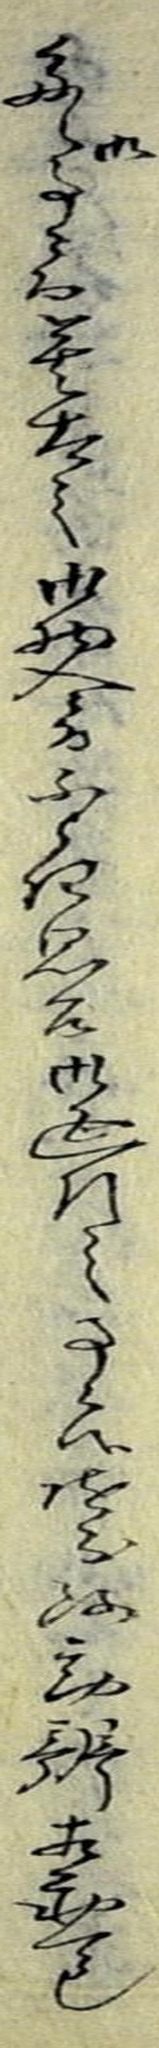多之御事ニ而莫太之御物入ニ付不被任思召御延引之事ニ候随分致勘弁相勤可申候
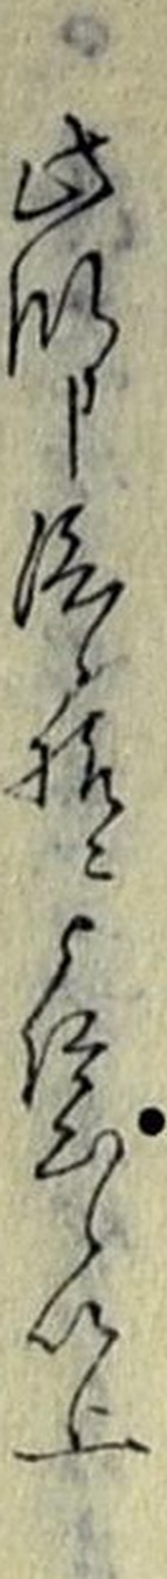此段申渡候様ニ被仰出候以上
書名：命令之部 一
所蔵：福井県文書館 Fukui Prefectural Archives
